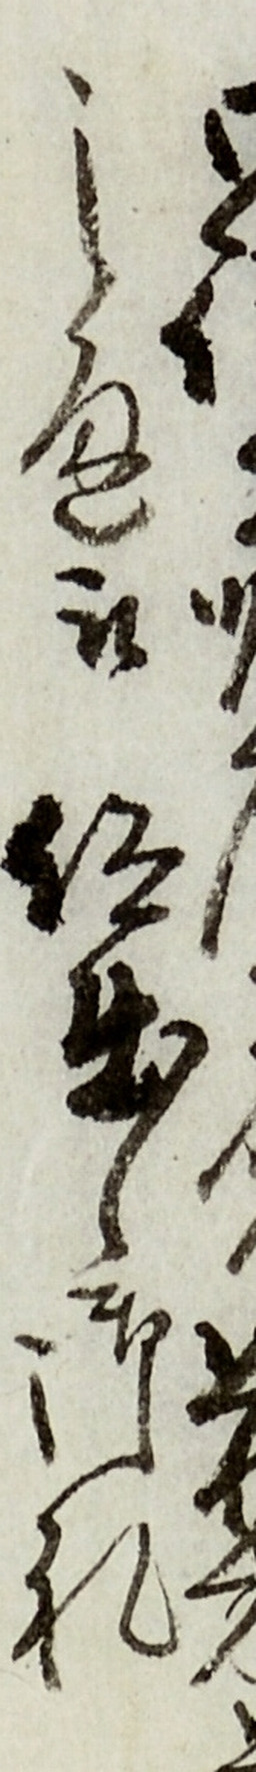之通被仰出候御礼
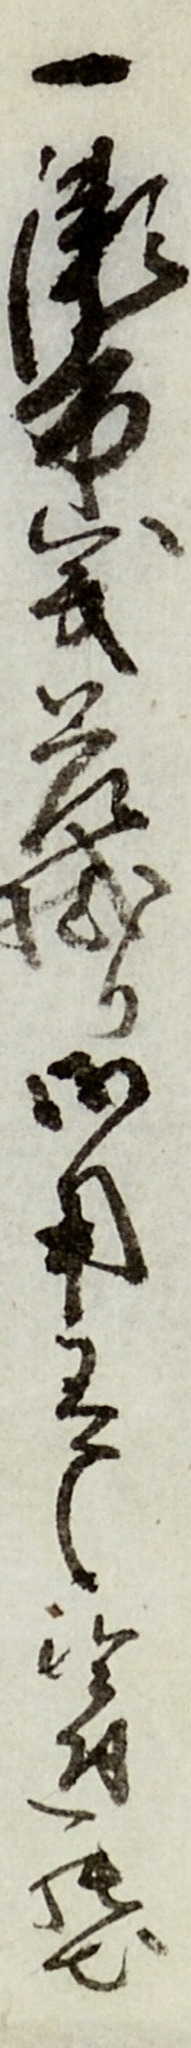一瀬市義差掛り御用有之候ニ付罷出
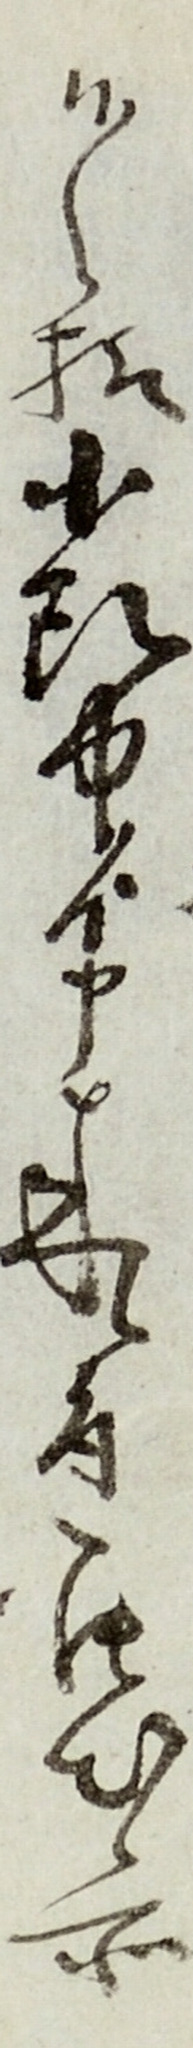候之様小頭中ゟ申来候ニ付罷出候所
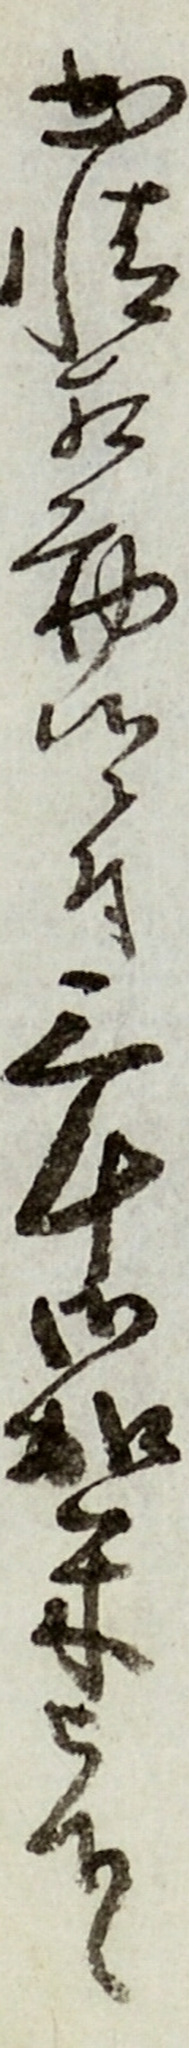出情相勤候ニ付三斗御加米被下候
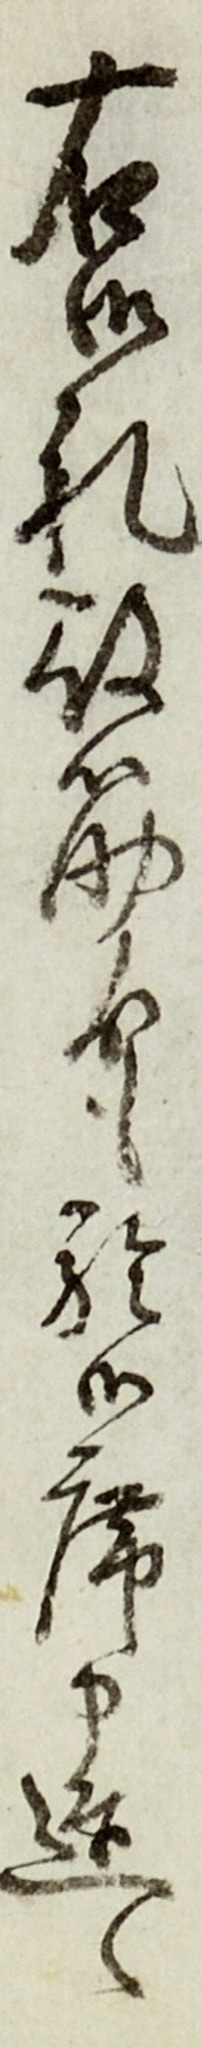右御礼役筋ゟも於御席申達候
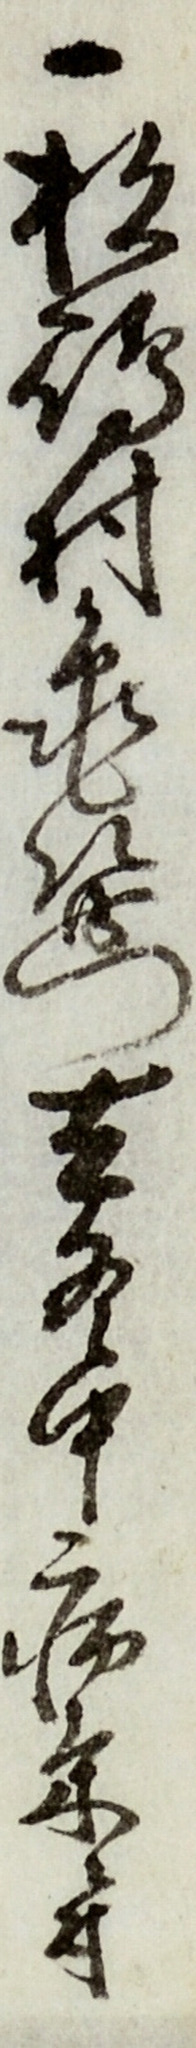一杉嶋村亀左衛門去冬中病気ニ付
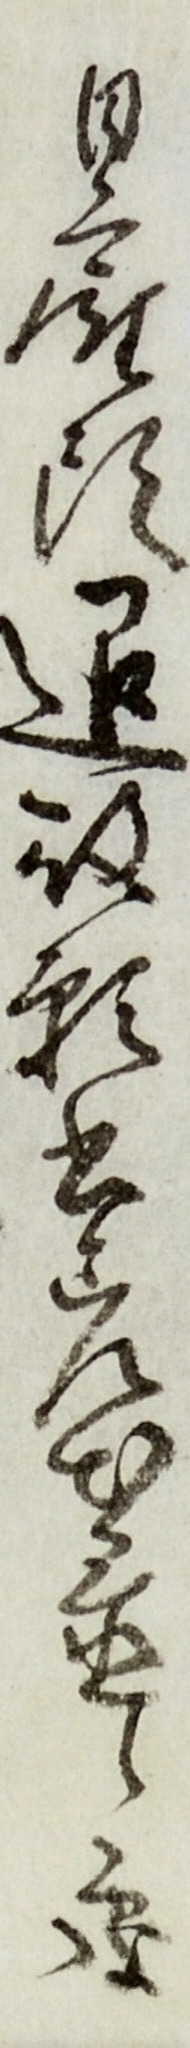日雇頭退役願書差出置候処
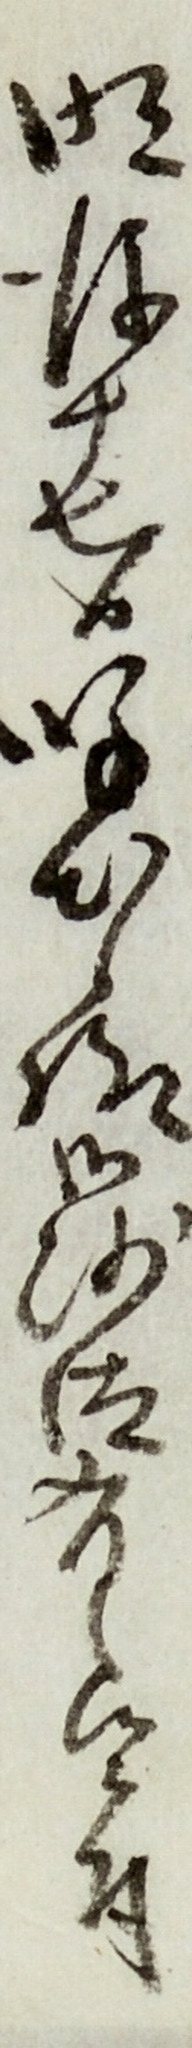明後十七日呼出候様御沙汰有之候ニ付
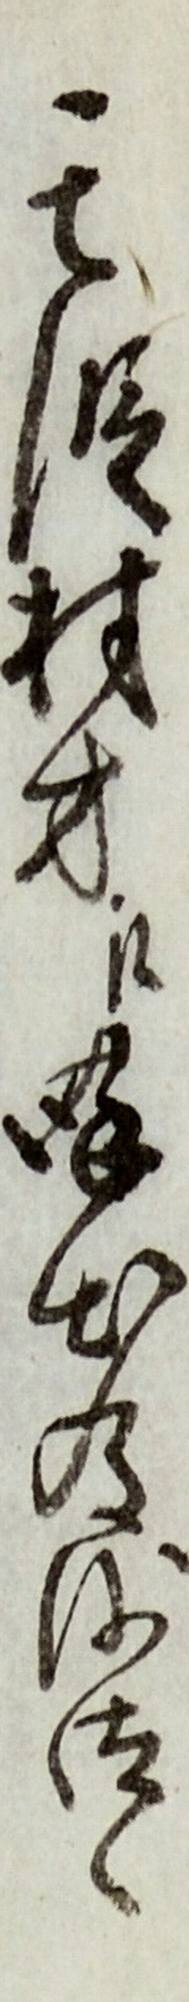其段村方江呼出及沙汰候
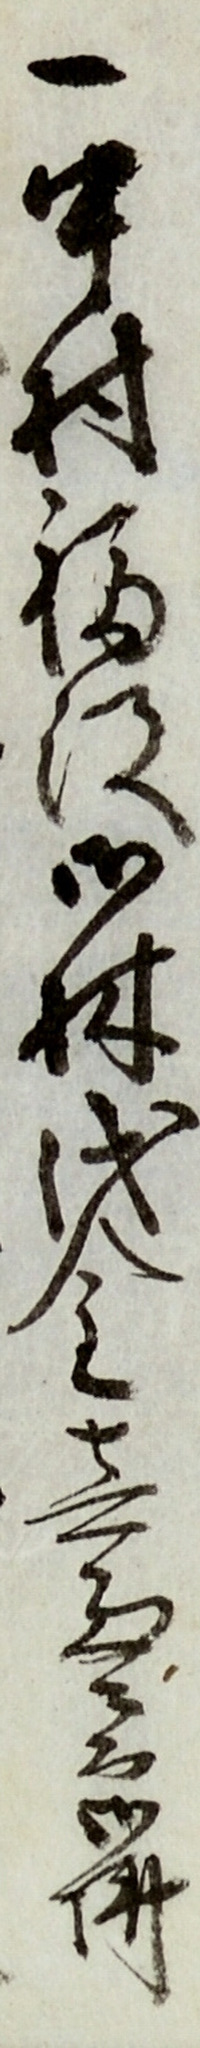一中村福沢御林代金壱両ニ而御払
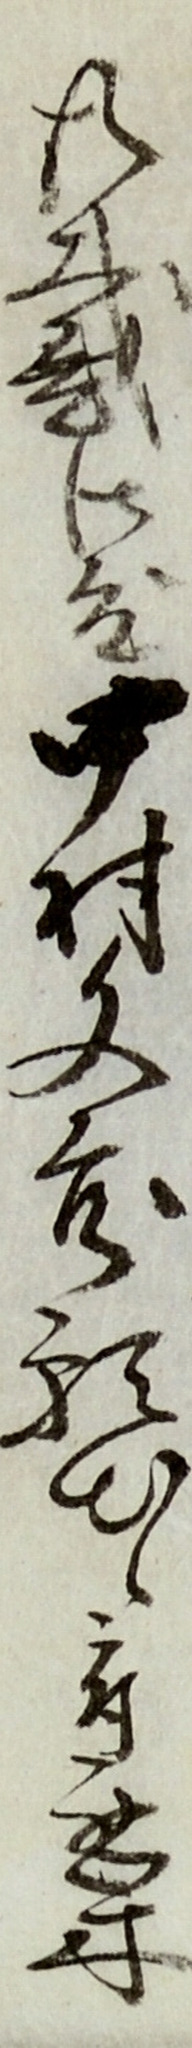頂戴仕度中村文蔵願出候ニ付悪木

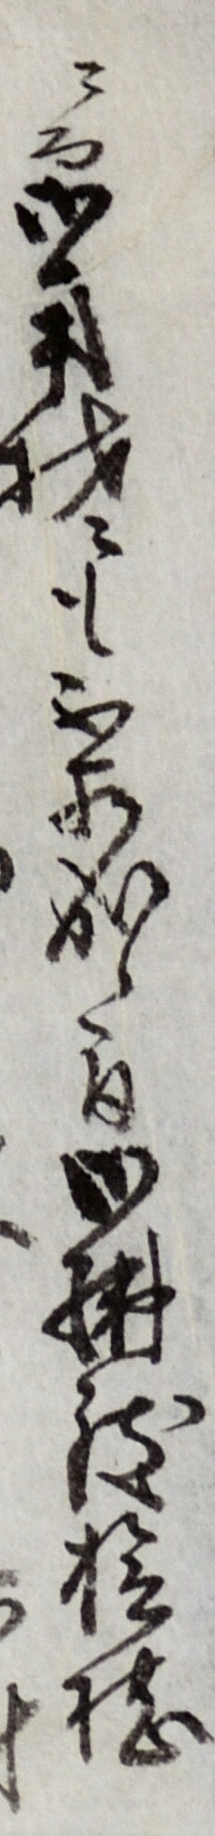ニ而御用材ニも不相成候間御払致桧椹
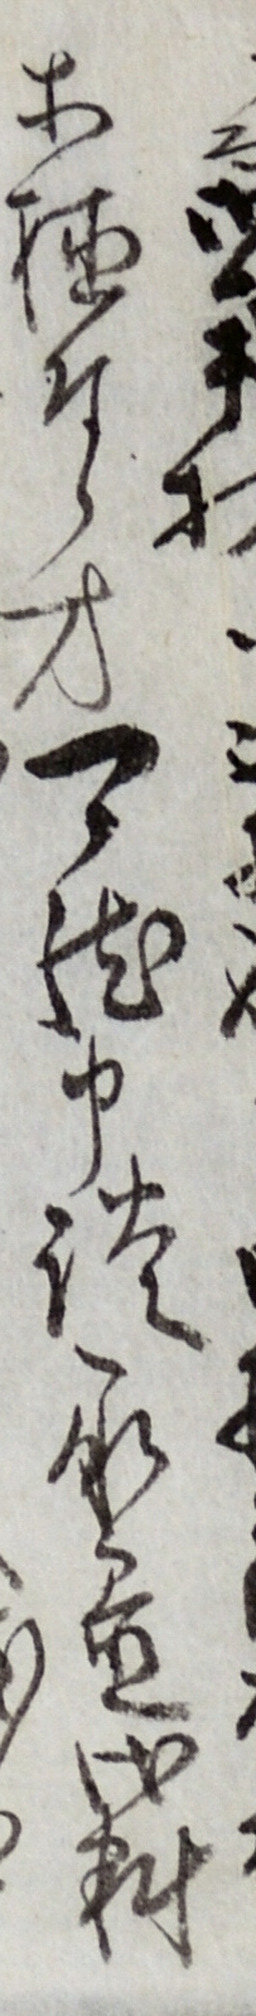等植付候方可然申談承置代料
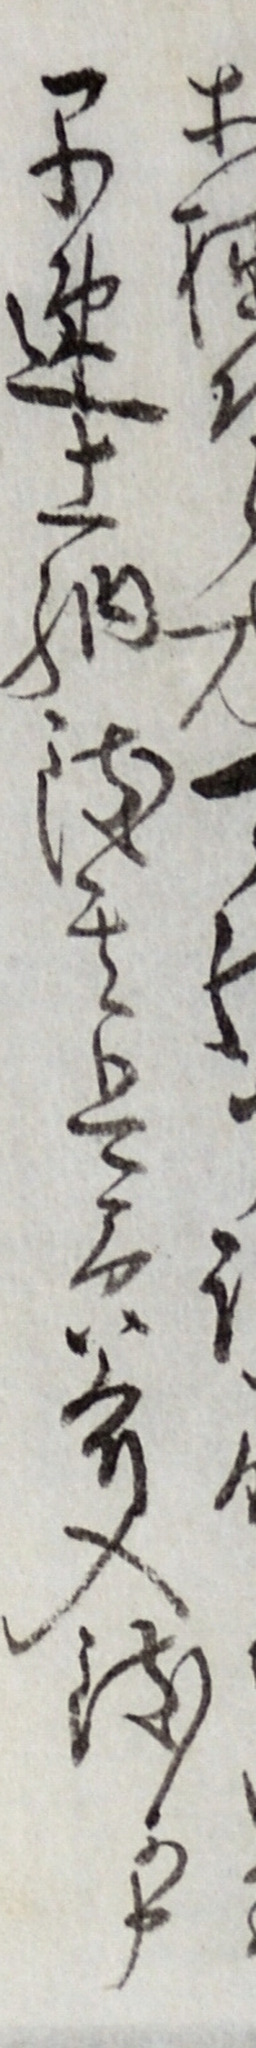早速上納致其上ニ而斧入致可申
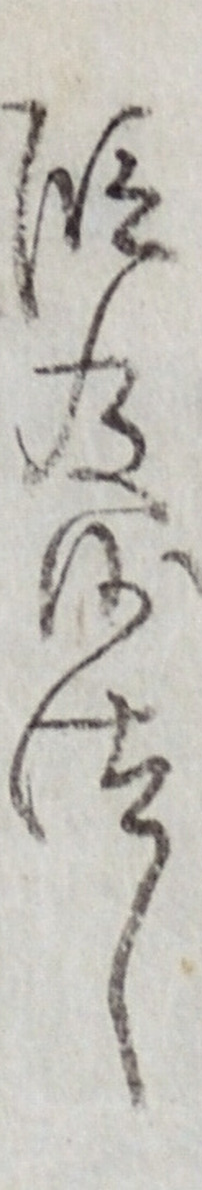段及沙汰候
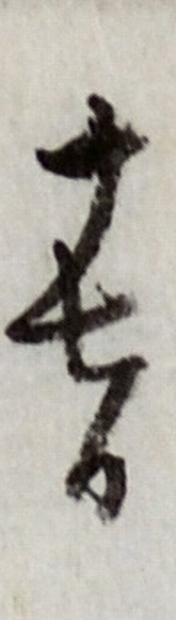十七日
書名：御山方御薪方諸事御用留
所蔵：伊那市立高遠町図書館・合同会社AMANE
